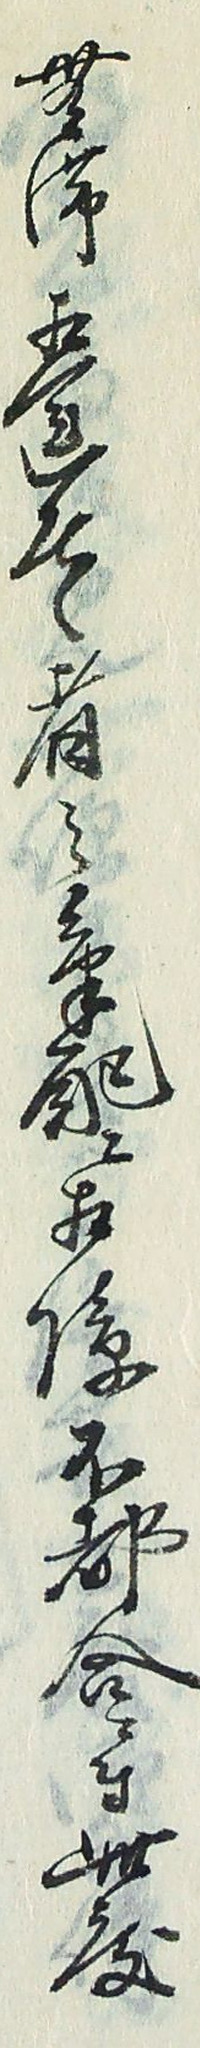無滞相運居候者之氣配ニ相障不都合ニ付此度
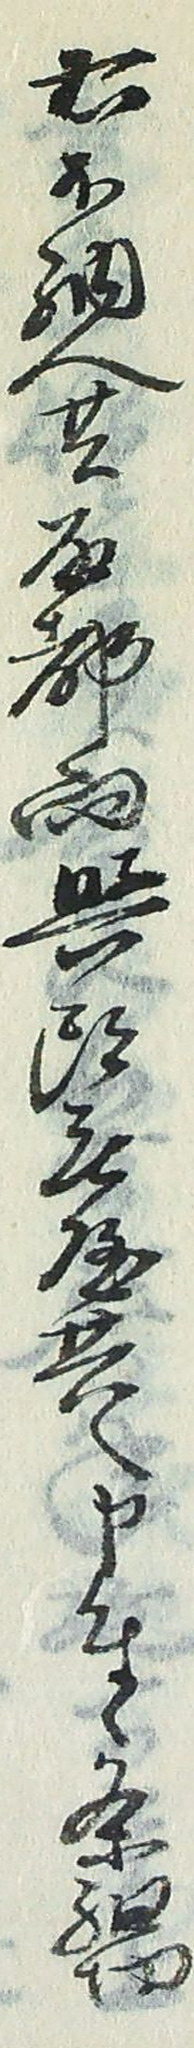右不納人共取都而與頭庄屋共へ申付候条組切
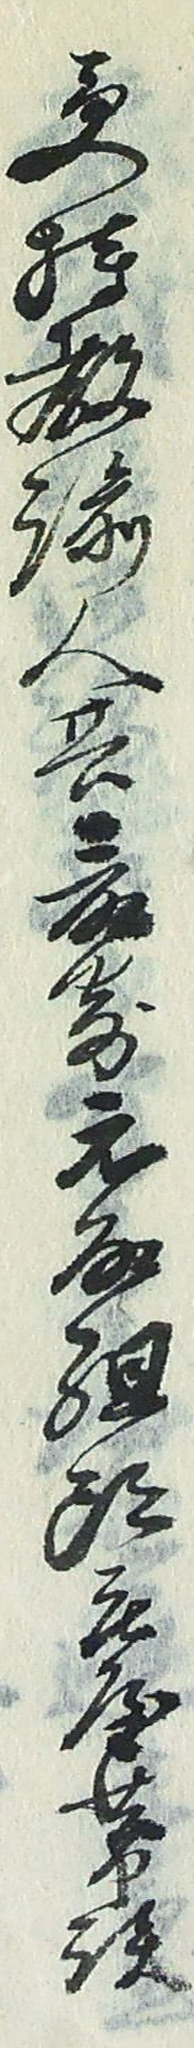受持教諭人共最寄元取組頭庄屋共申談
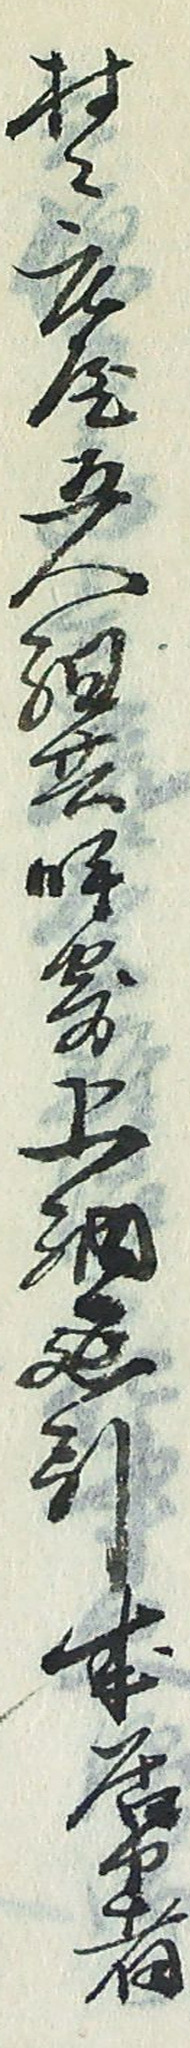村々庄屋五人組共呼寄上納延引成居申者
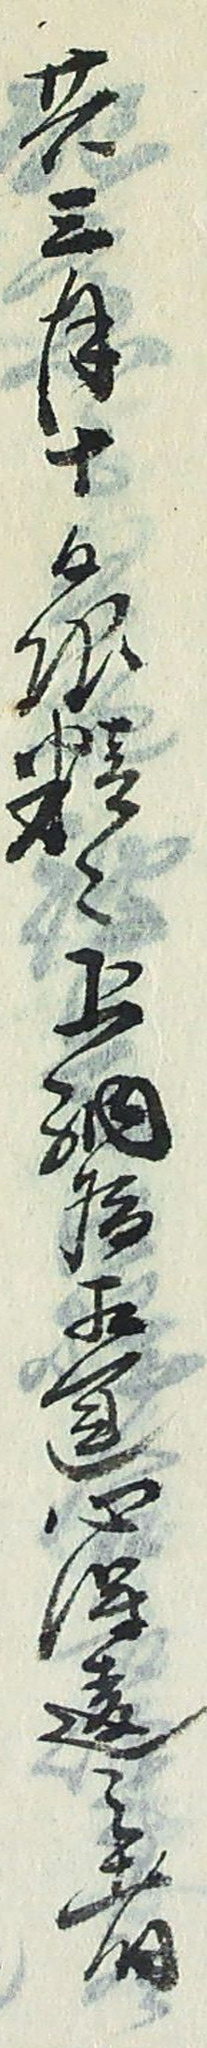共三月十日限精々上納為相運心得違之者
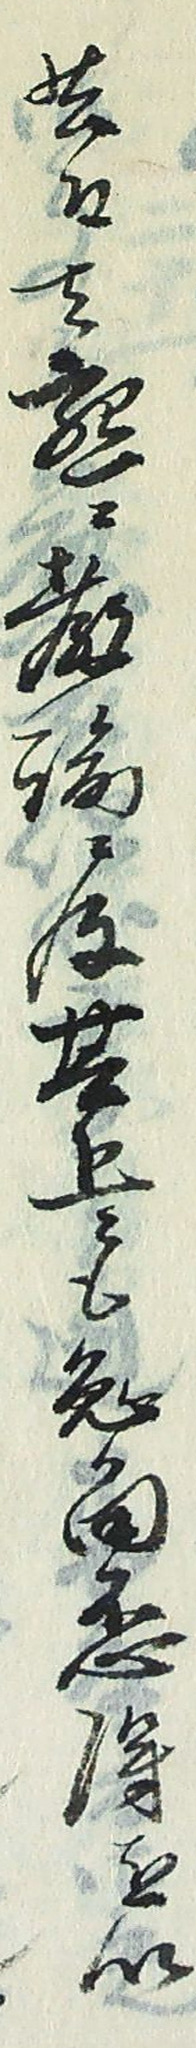共江者懇ニ教諭ニ及其上ニも兎角不心得を以
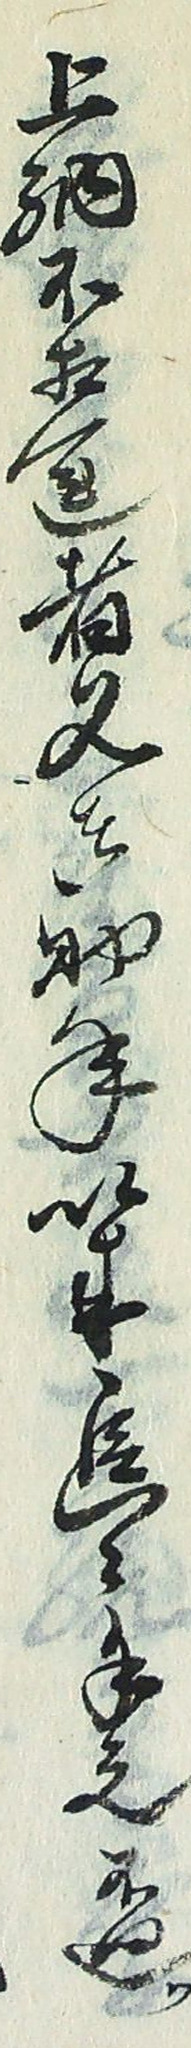上納不相運者又者初年以来追々手元不廻り
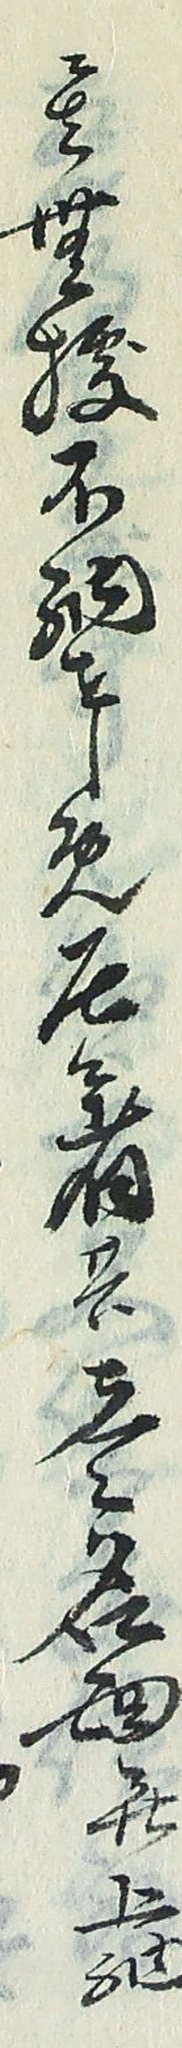ニ者無據不納せしめ居候者共夫々名面幷上納
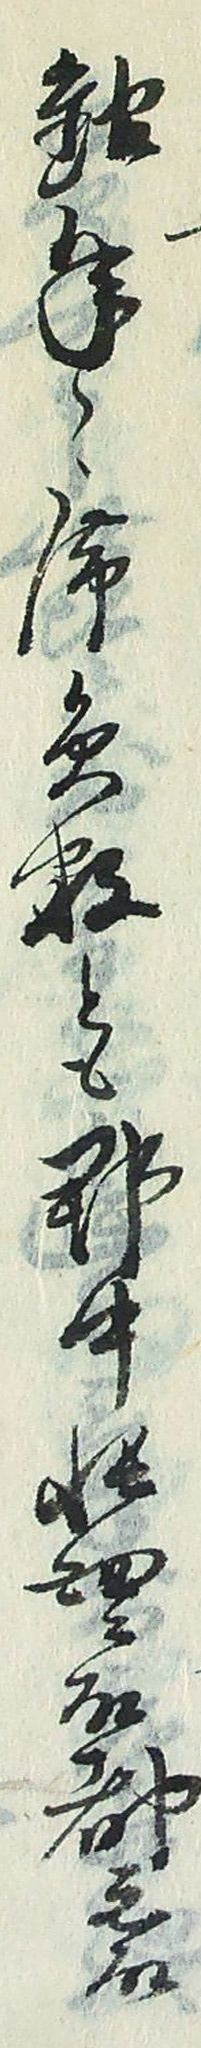銀年々滞員数とも郡中帳面ニ取都元取
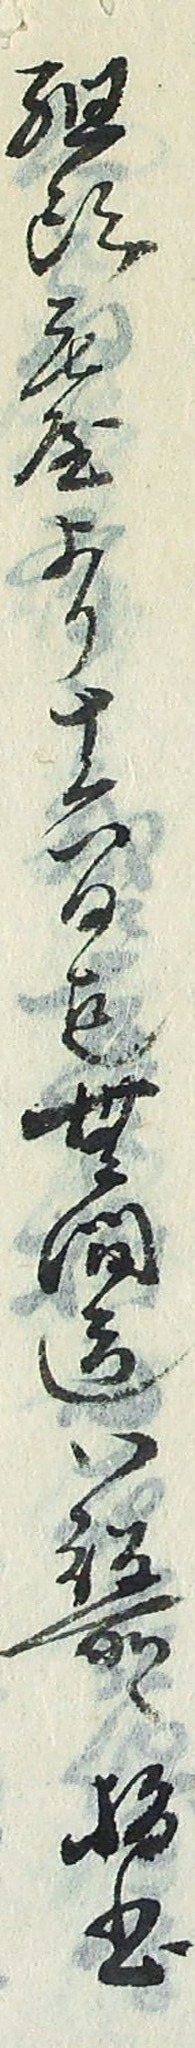組頭庄屋より十六日迄無間違御役所へ指出
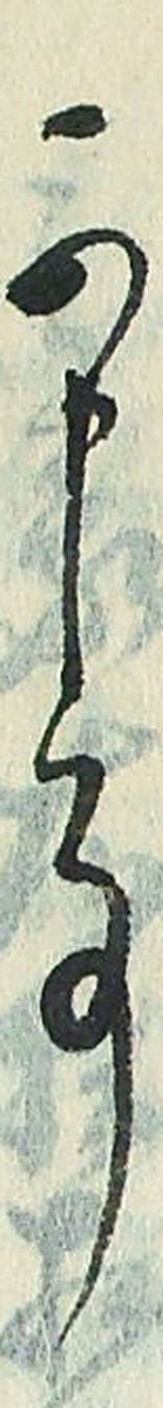可申事

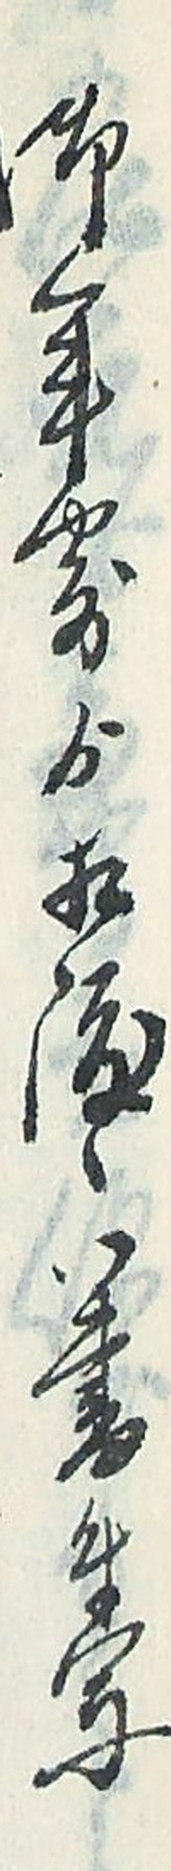御年寄ゟ相渡候御書付写
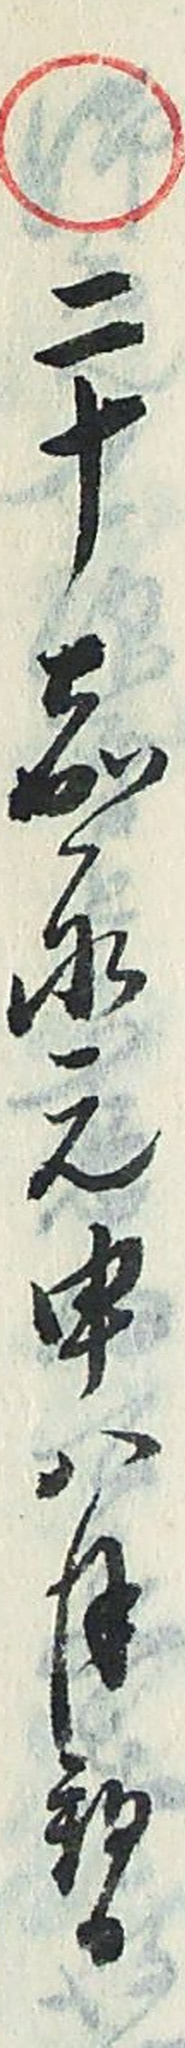○二十嘉永元申八月朔日
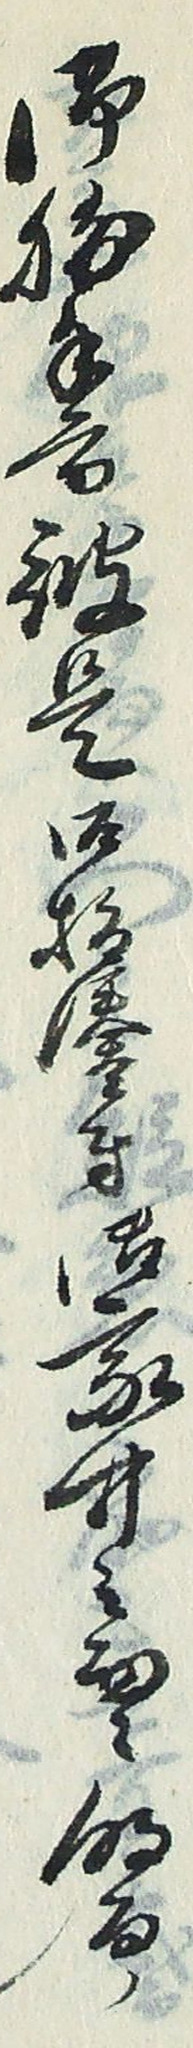御勝手方彼是御指湊ニ付御家中之面々明酉
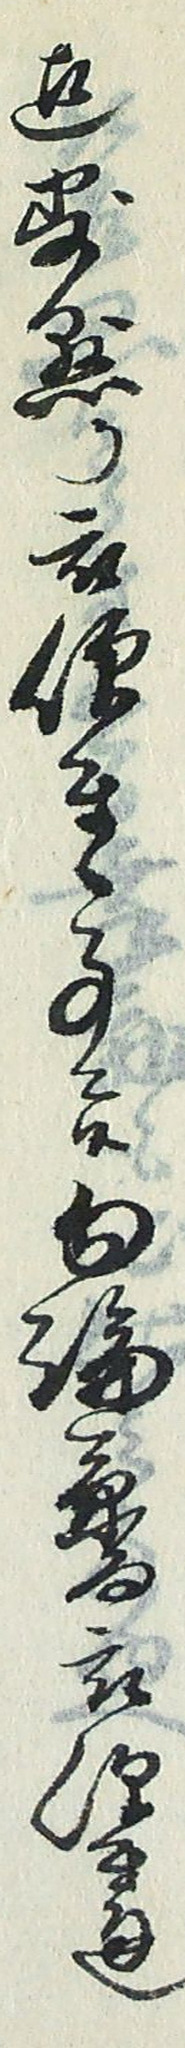迄歩懸り被仰付候事ニ候勿論兼而被仰付通
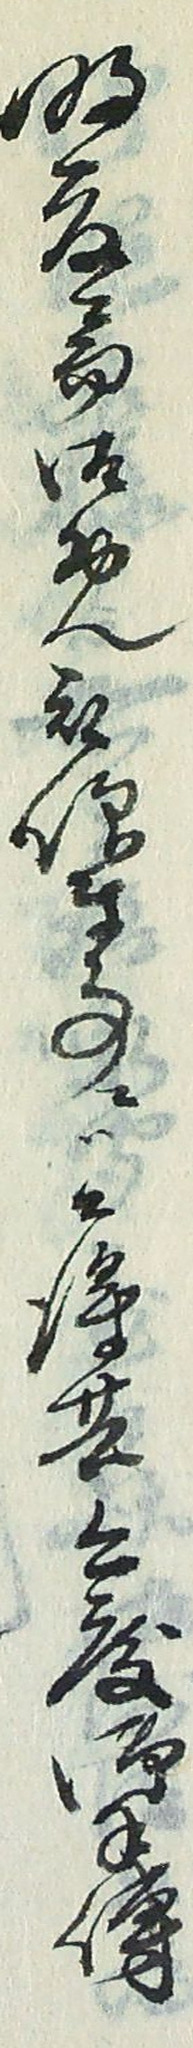明夏ニ而御免被仰付事ニハ候得共今度御手傳
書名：諸御趣意書并御下知向之写
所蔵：鳴門教育大学 Naruto University of Education
